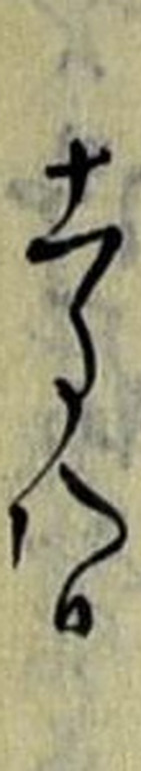十一月八日
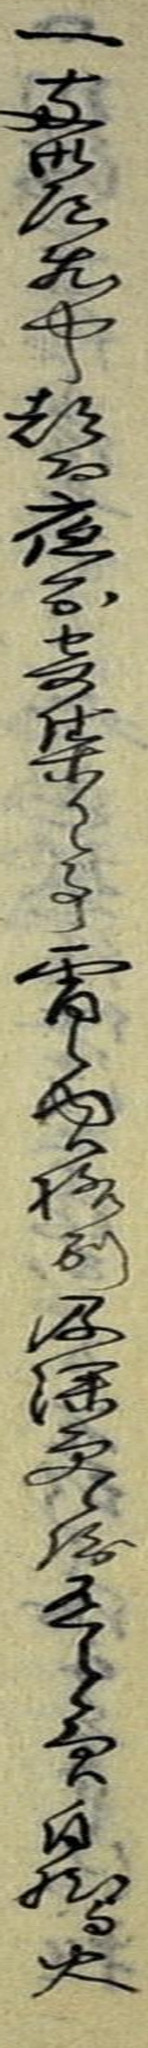一両御屋敷中都而夜分寄集り候事宵之内ハ格別及深更候儀有之候而ハ自然与火
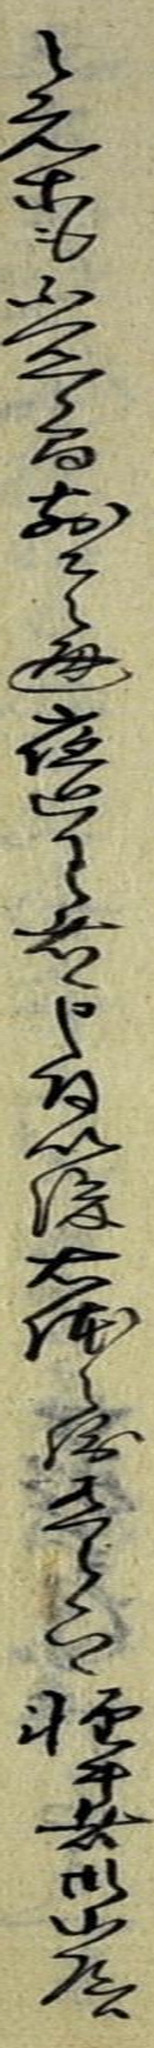之元等も不宜候間前々之通夜廻り之者へ申付以後右体之儀有之候ハヽ軽キ者御小屋ハ
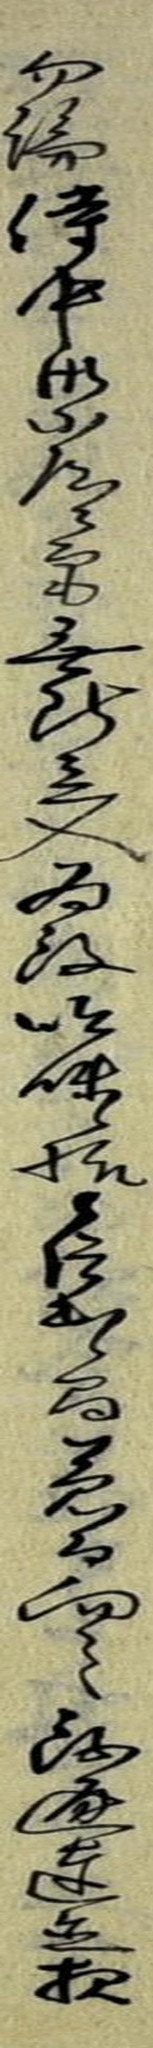勿論侍中御小屋ニ而も無断立入為致吟味候様被仰出候間兼而向々へ致通達置夜
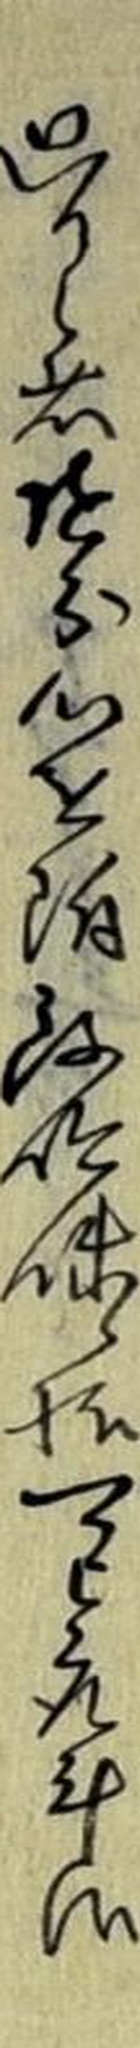廻り之者随分心を付致吟味候様可被取計候
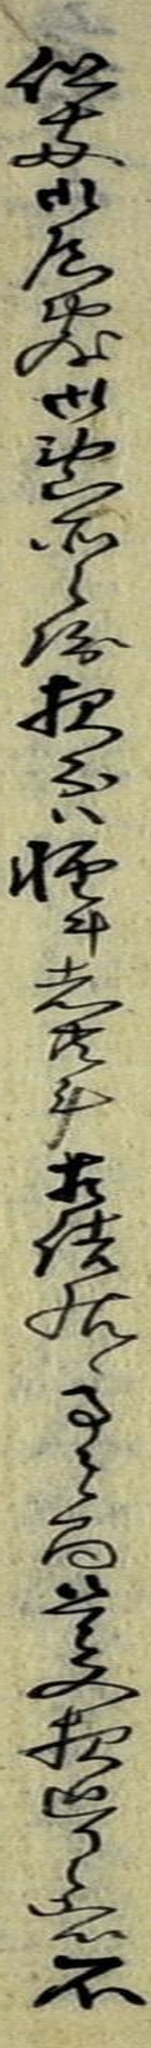但領御屋敷御台所之儀夜分ハ軽キ者共斗相詰居候事ニ候間是又夜廻り之者不
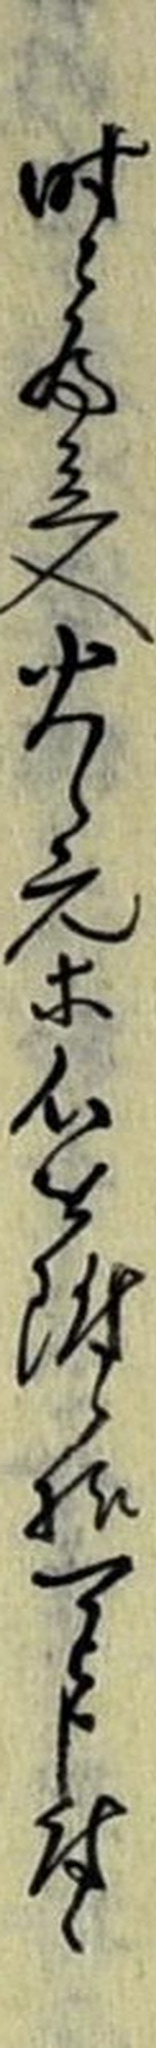時ニ為立入火之元等心を付候様可被申付候
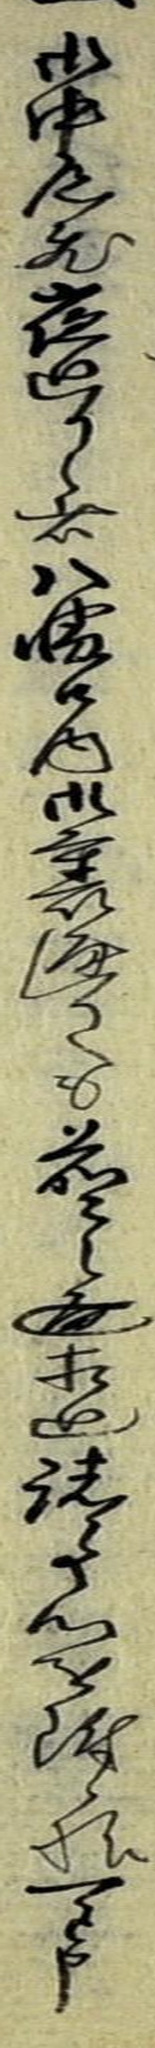一御中屋敷夜廻り之者八幡口内御裏通りへも前々之通相廻諸事心を付候様可被申
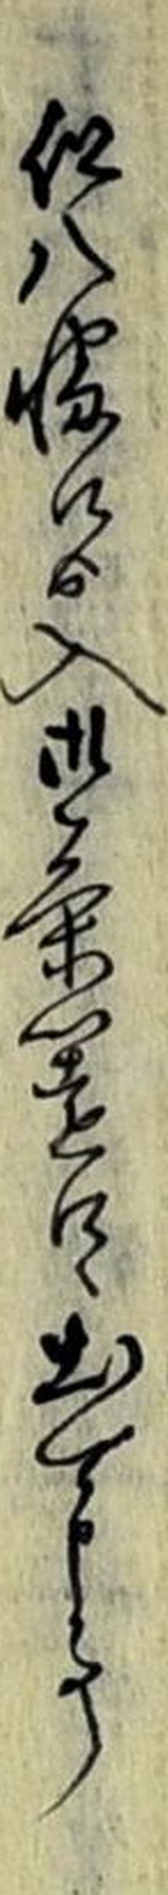但八幡口ゟ入御茶園口へ出可申事
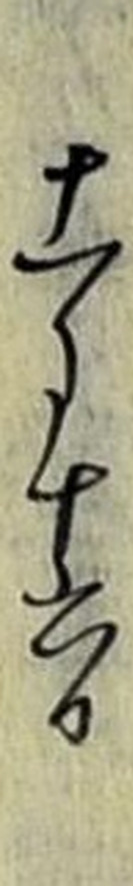十一月十六日
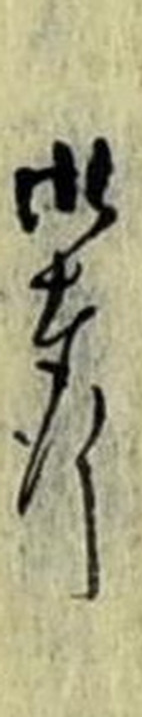御奉行
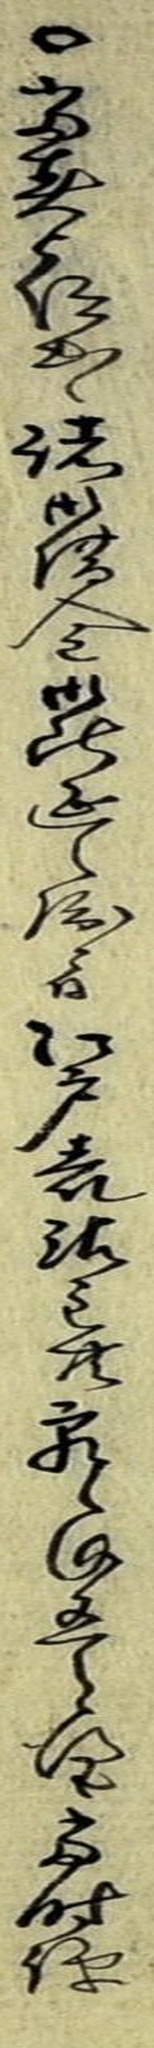〇当春被仰出候諸御借金御断延之儀ニ付江戸表銀主共願之趣有之候得共当時評
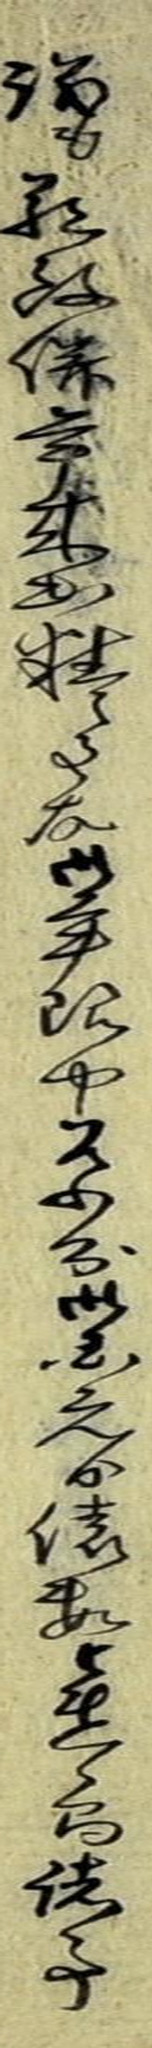議も難致併年来出精之事故御年限中乍少分御国元ゟ俵数被遣候間諸事
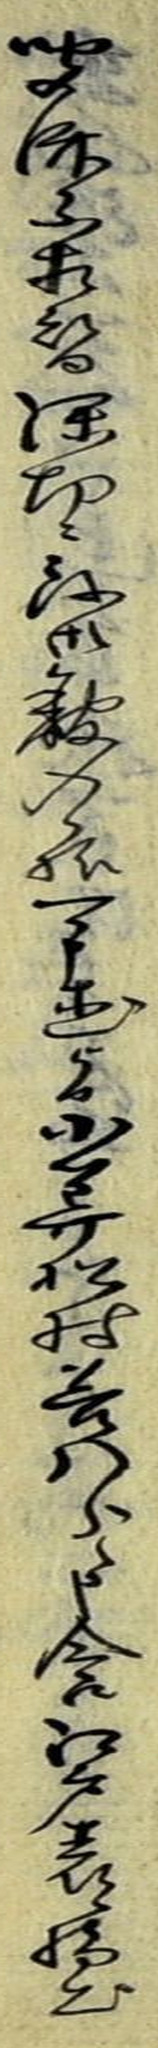聞済不相替深切ニ致御候様可申述旨小算松村善八郎へ申含江戸表へ指出

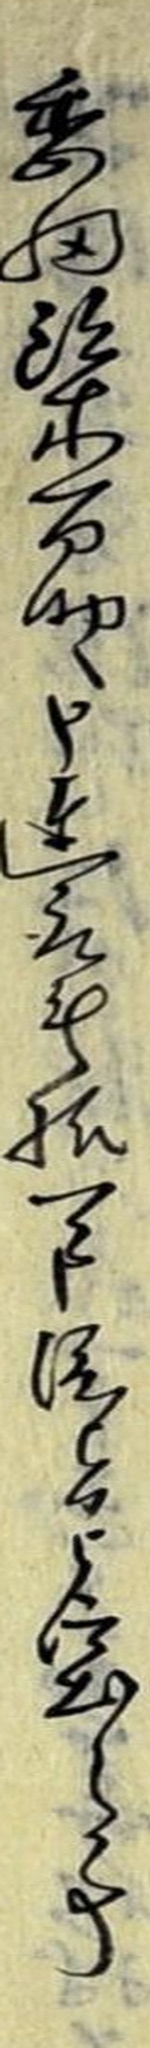委細鈴木百助へ申達取計候様可申渡旨被仰出候事
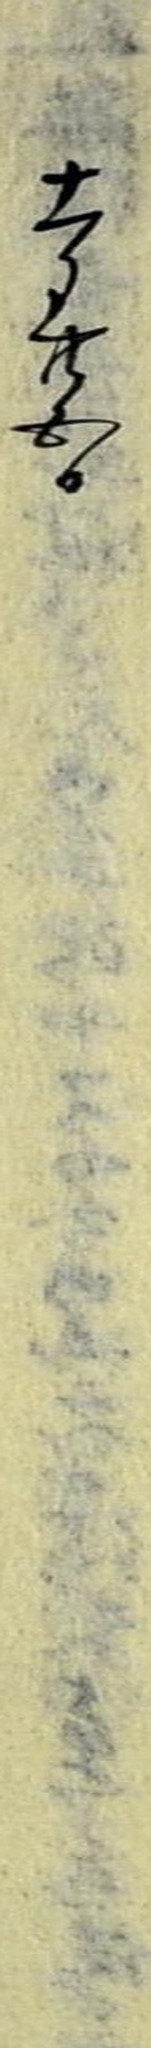十一月廿五日
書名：命令之部 三
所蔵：福井県文書館 Fukui Prefectural Archives
